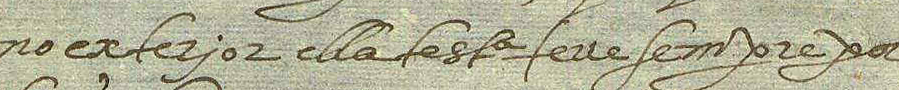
no exterjor ella testa teue sempre por
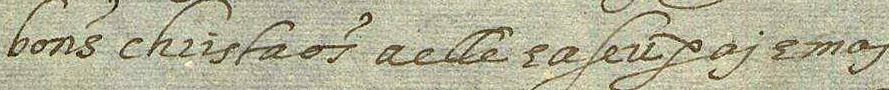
bons̄ christaos̄ a elle E a seu paj E maj
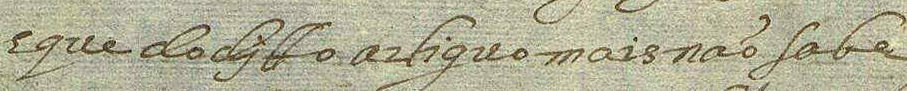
E que do djtto artiguo mais naõ sabe
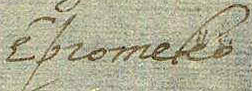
E prometeo
